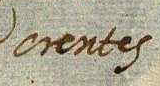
crentes
